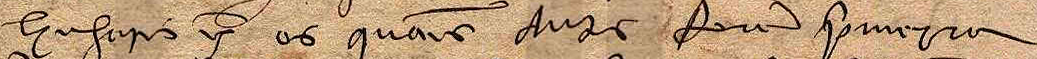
lynhares c̄ꝭ os quaes Autos forā p̄meyra
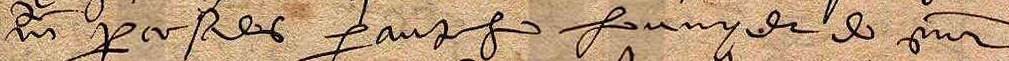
mte ꝓcesados ꝑante ho ouuydor do sn̄or
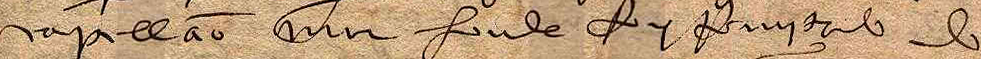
capellão mor honde foy Remjtido do
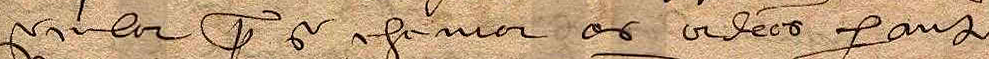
secular p̄o se chamar as ordēs ꝑante
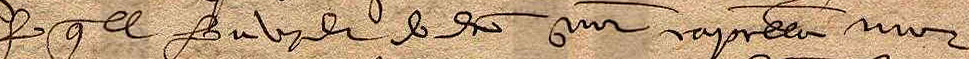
ho q̄ll houvydor do dtō snōr capellā mor
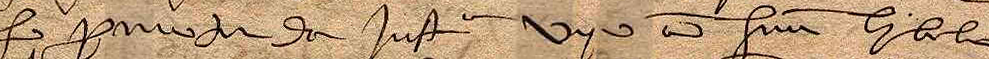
ho ꝓomotor da Justa veyo c̄o huū ljbelo
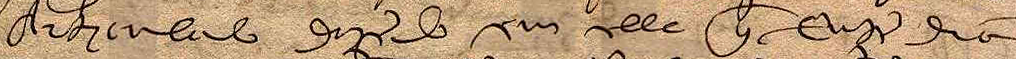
Artjculado dizēdo em elle q̄ Entēdia
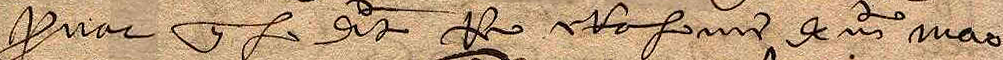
ꝓuar q̄ ho dito Reo era homē de mto mao
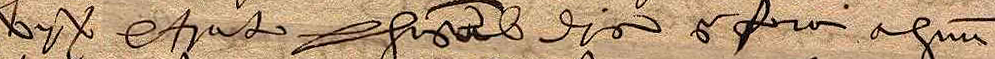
vyꝟ e trato e husādo djso se fora a huū
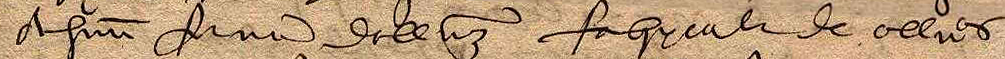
A huū fernādalluz̄ fabrycador de alluas
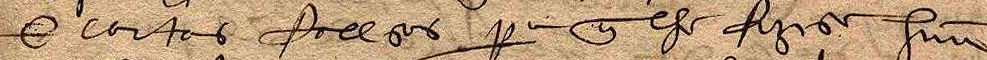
E cartas fallsas ꝑa q̄ lhe fizese huū
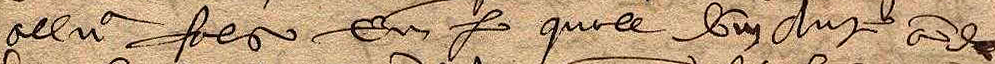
allua falso Em ho quall dom Anto cōde
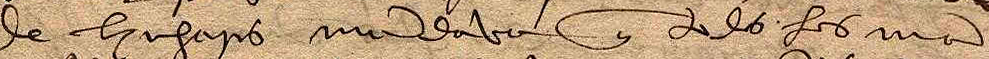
de lynhares mādava q̄ todo hos mā
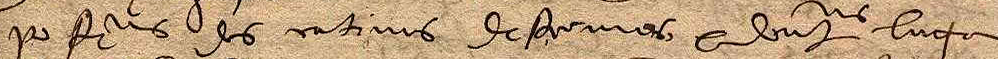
posteyros dos catiuos destremos e doutros luga
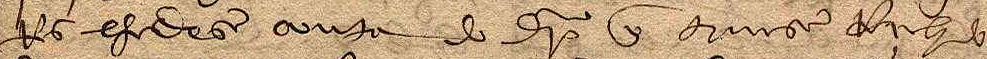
Res lhe desē conta do drro q̄ tiuesē Recebjdo
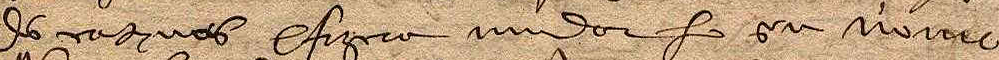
dos catyuos e fizera mudar ho seu nome
